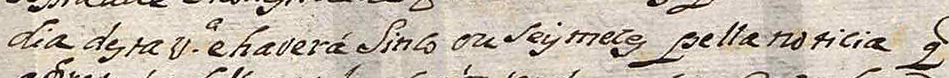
dia desta v.a e haverá Sinco, ou seis mezes pella noticia q̄
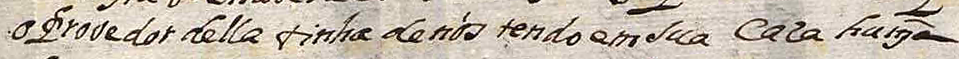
o Provedor della tinha de nós tendo em sua caza hum̄s
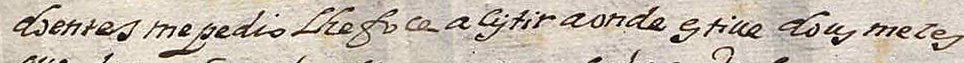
doentes me pedio lhe foce acistir aonde estiue dous mezes
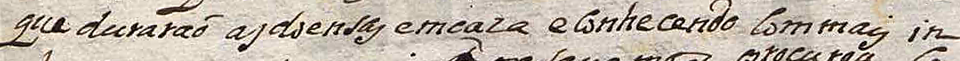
que duraraõ as doensas em caza e conhecendo com mais in
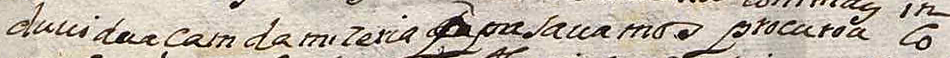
duuiduaçam da mizeria q̄ pasauamos procurou Co
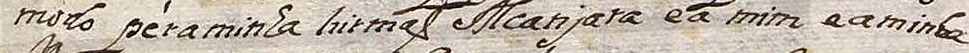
modo, pera minha hirmā Alcatijara e a mim e a minha
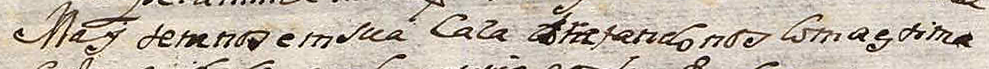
May setanos em sua caza e tratando nos com a estima
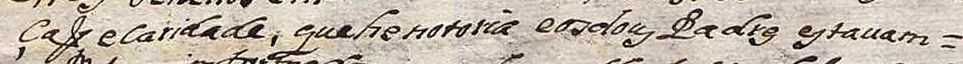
çaõ e caridade, que he notoria e os dous Padres estauam
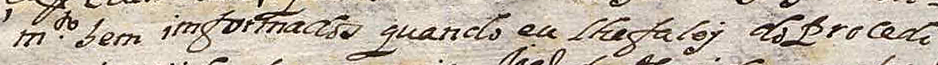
m.to bem imformados quando eu lhe faley do Procedi
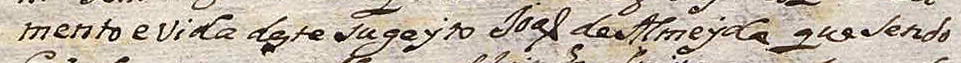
mento e vida deste sugeyto Ioaõ de Almeyda que sendo
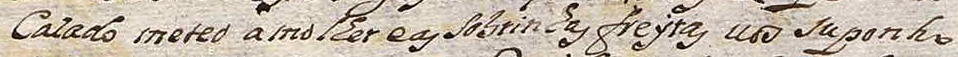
Cazado meteo a molher e as sobrinhas freytas uos suponho
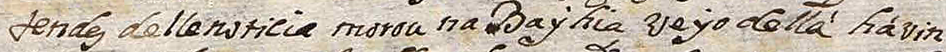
tendes delle noticia morou na Bayhia veyo dellá há vin
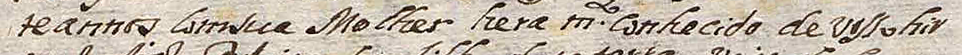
te annos com sua Molher hera m.to conhecido de vosso hir
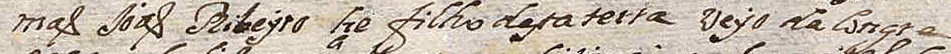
maõ Ioaõ Ribeyro he filho desta terra veyo da Congre
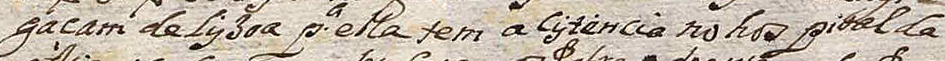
gaçam de Lisboa p.a ella tem acistencia no hospital da
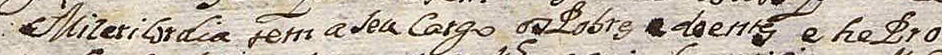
Mizericordia tem a seu Cargo os Pobres e doentes e he Pro
